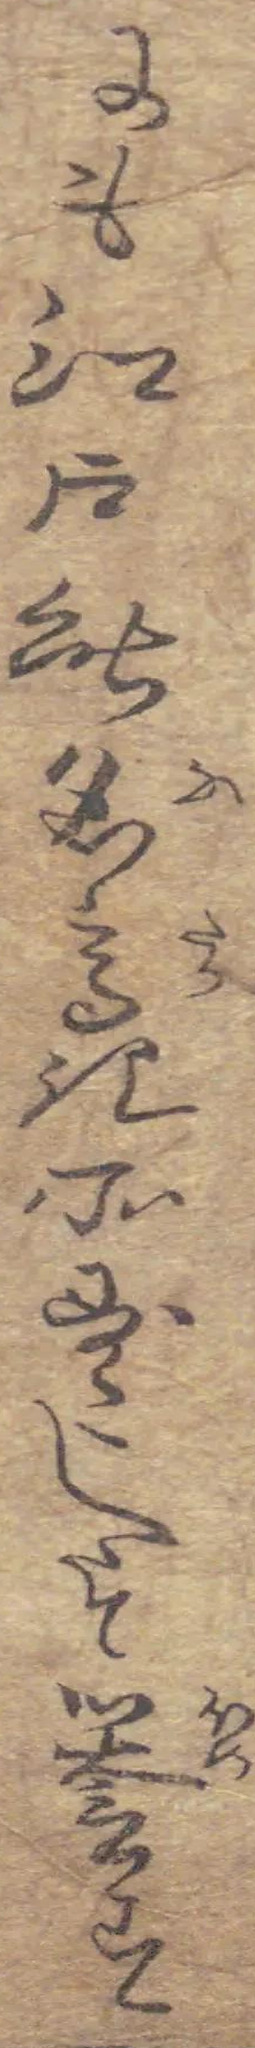にも江戸の名高き所すこしも誉す
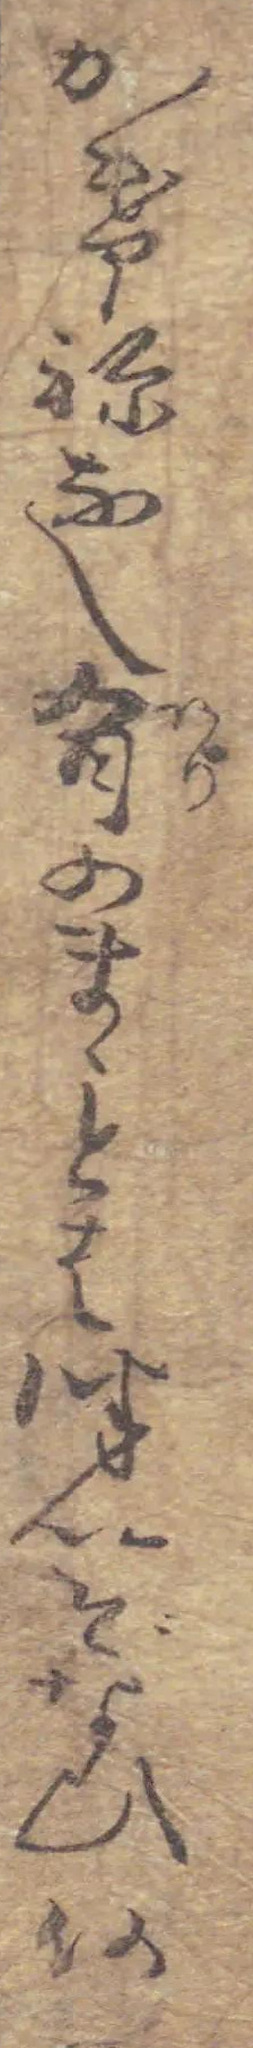かけねなし有のまゝとはついそない何の
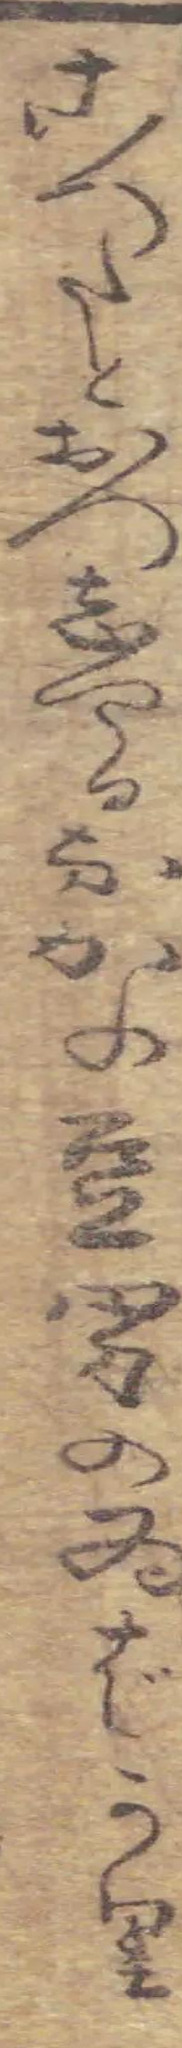こつたとおつしやるなかの豆男のゐばかり
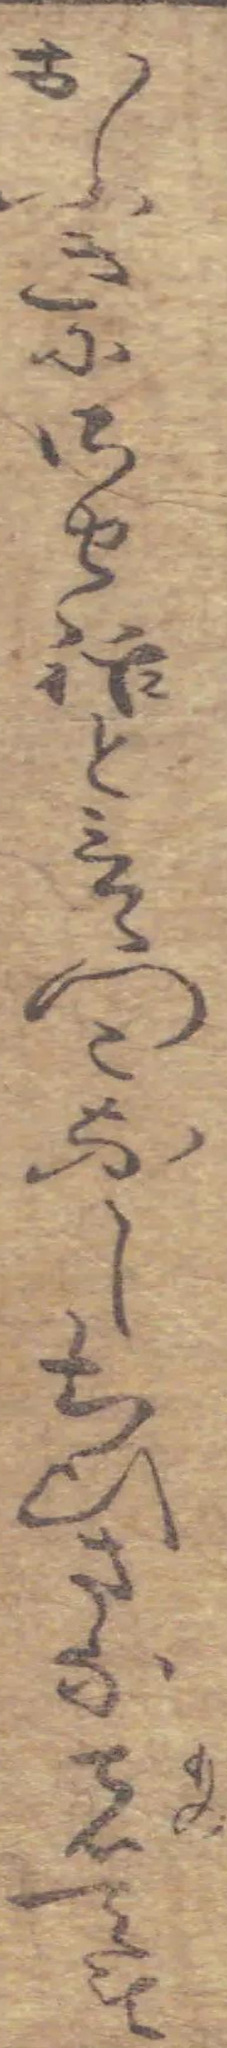おふきに御せ話と言つこなしちひさな者ても
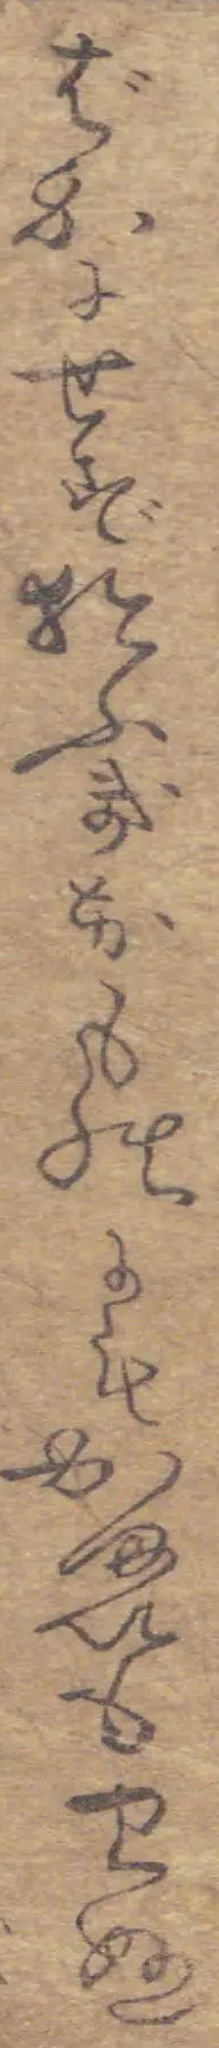ばかにせずおふきなものにもかまいもせぬ
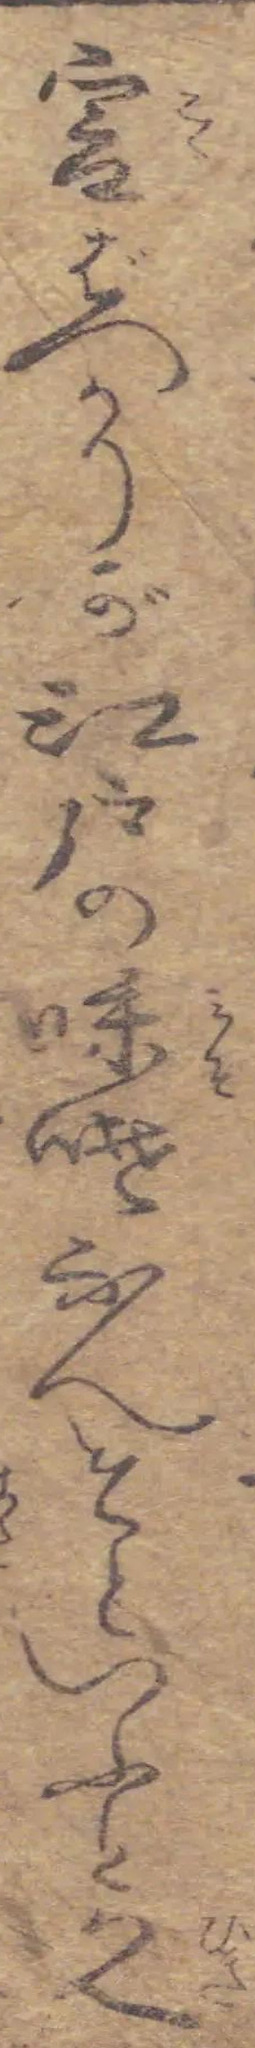爰ばつかりが江戸の味噌なんそといふと久
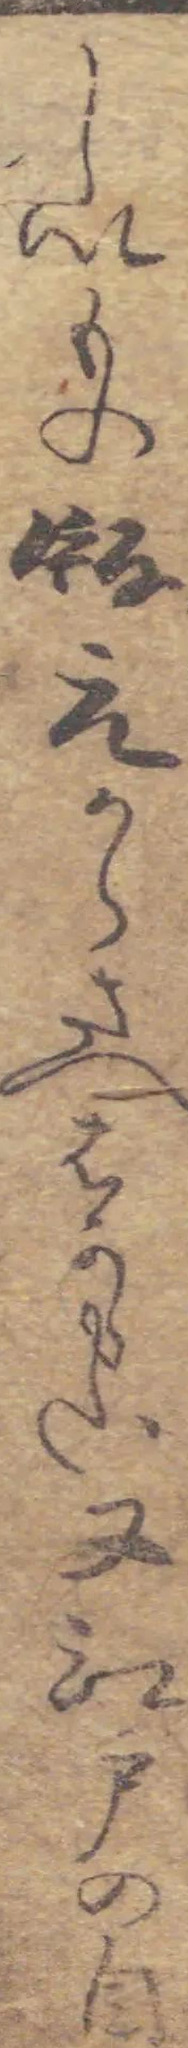しいもの版元からさへはからしい又江戸の自
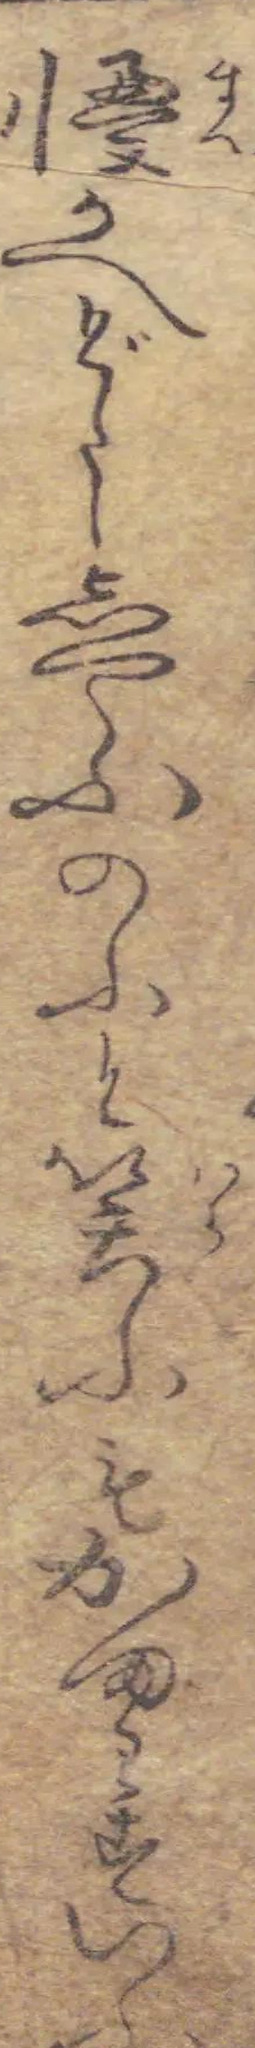慢かへどうしやふのふと笑ふもかまわすいふ
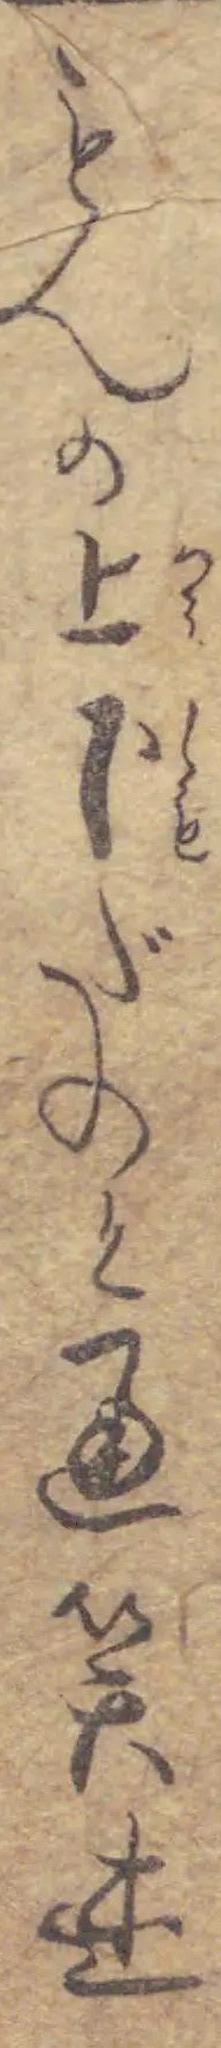もんの上下だのと通笑述
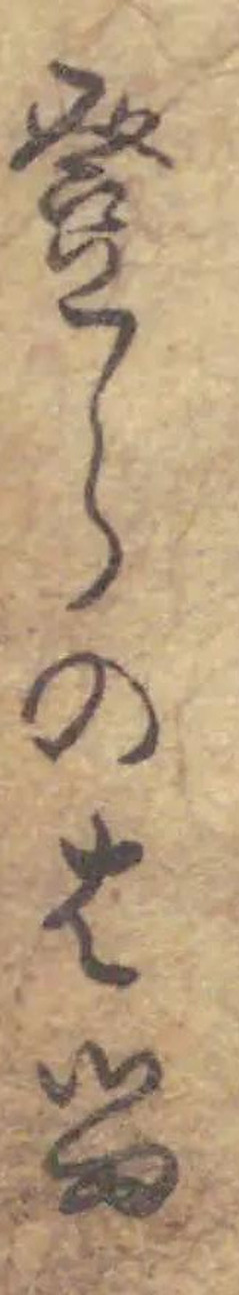とらのはる

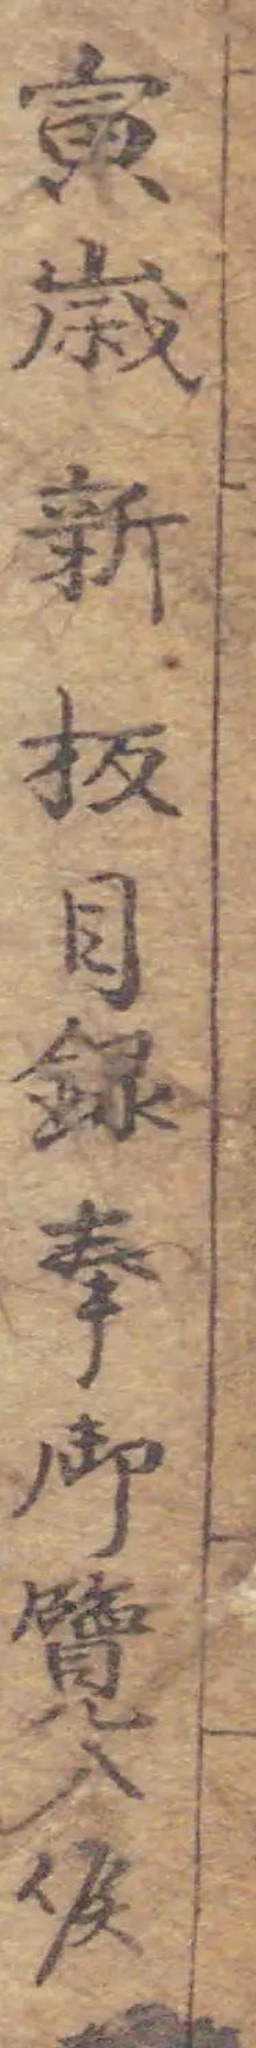寅年新板目録奉御覧入候
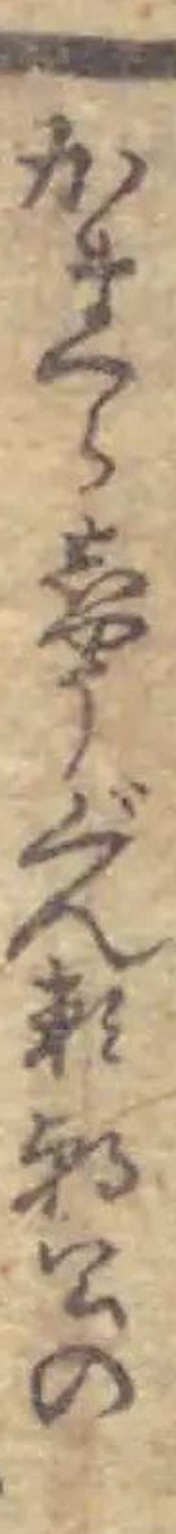かまくらしやうぐん頼朝公の
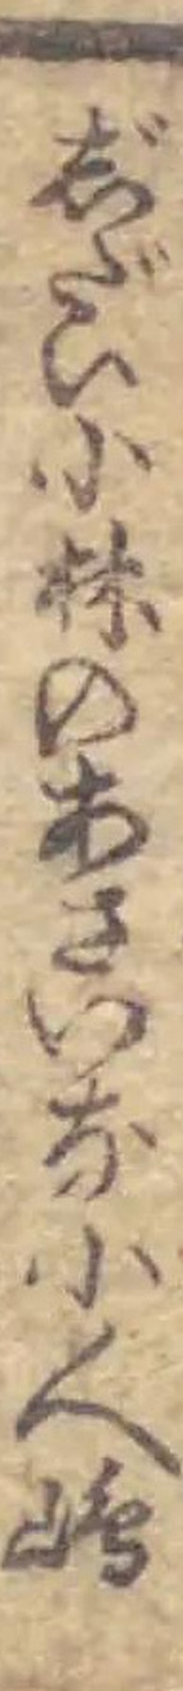じだい小林のあさつな小人嶋
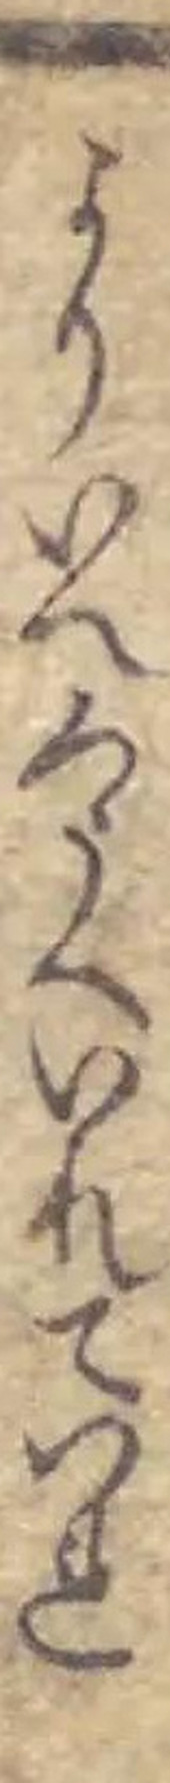よりいんろうへいれてつれ
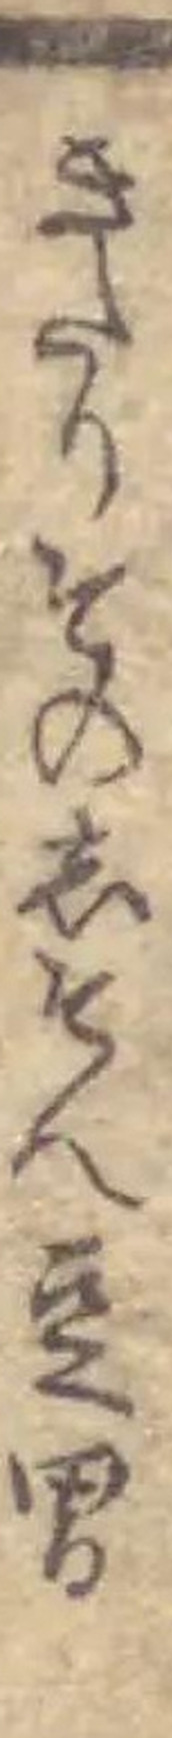きたりそのしそん豆男
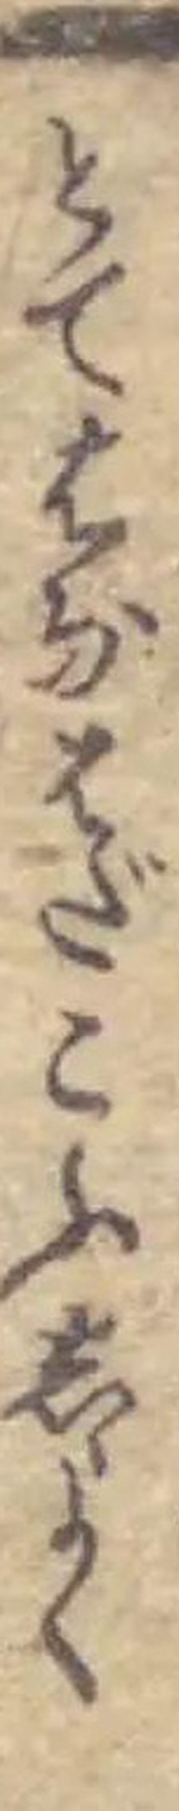とてはなはだこふしよく
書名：豆男江戸見物 2巻
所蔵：国立国会図書館 National Diet Library, JAPAN
